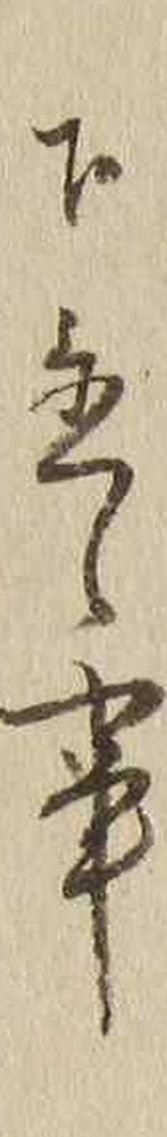下置候事
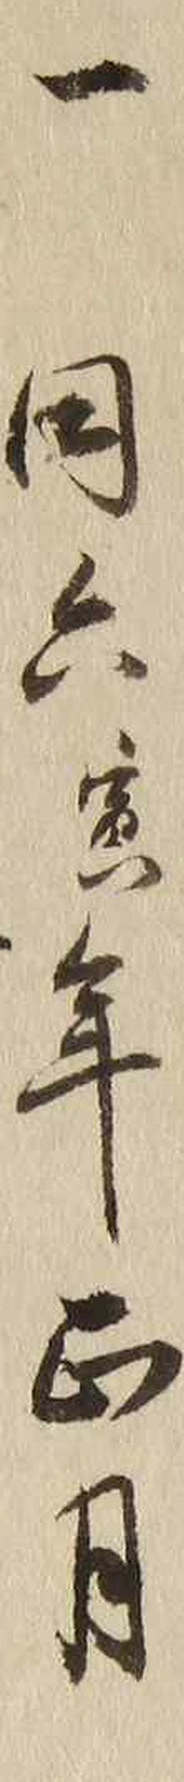一同六寅年正月
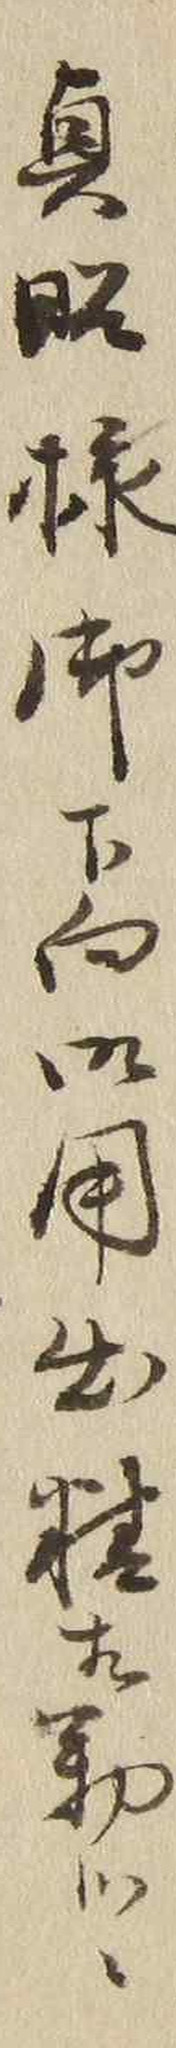貞昭様御下向御用出精相勤候ニ
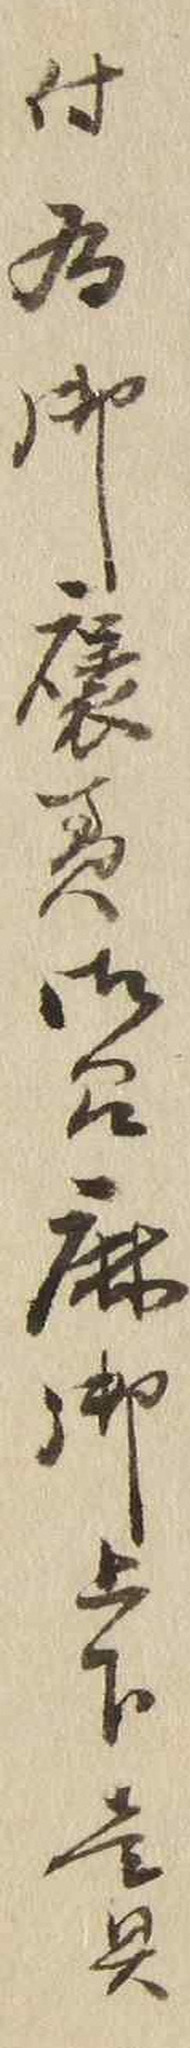付為御褒美御召麻御上下壱具
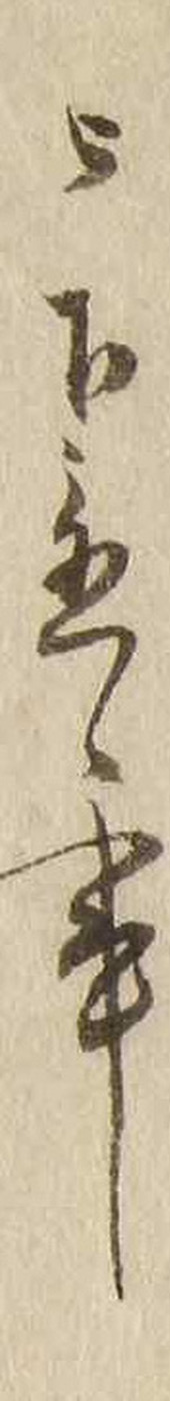被下置候事

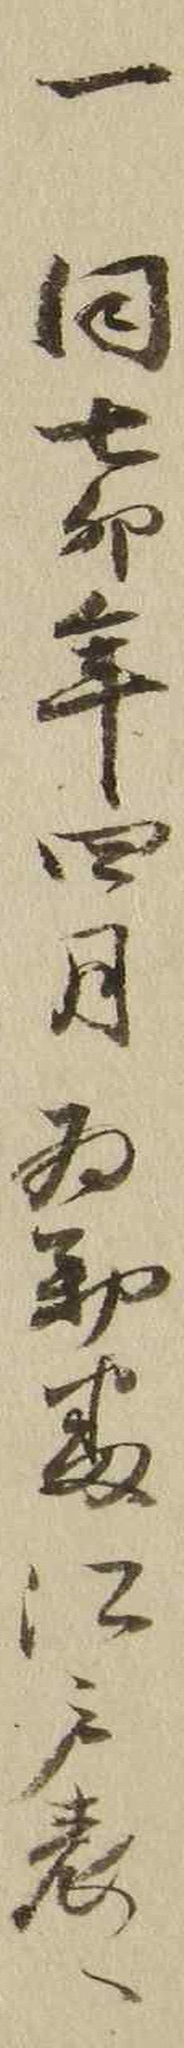一同七卯年四月為勤番江戸表へ
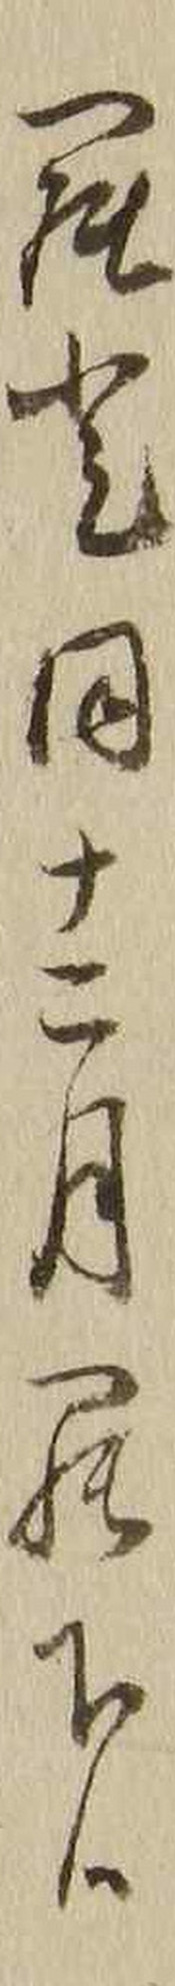罷登同十二月罷下候
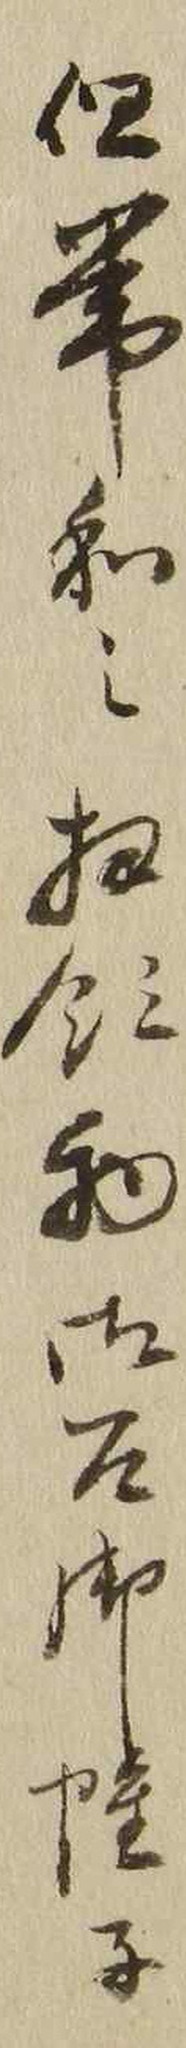但常和之拝領物御召御帷子
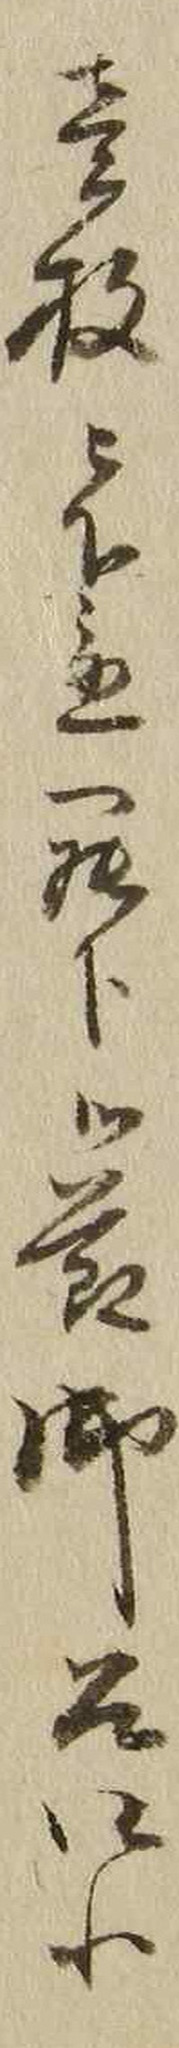壱枚被下置罷下候節御召御小
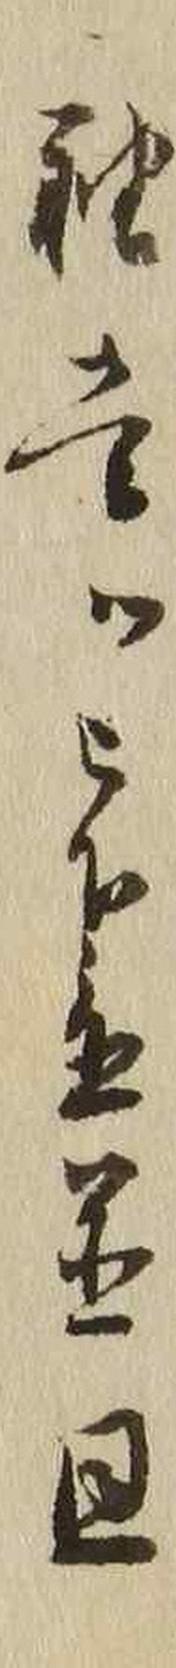袖壱ツ被下置並且
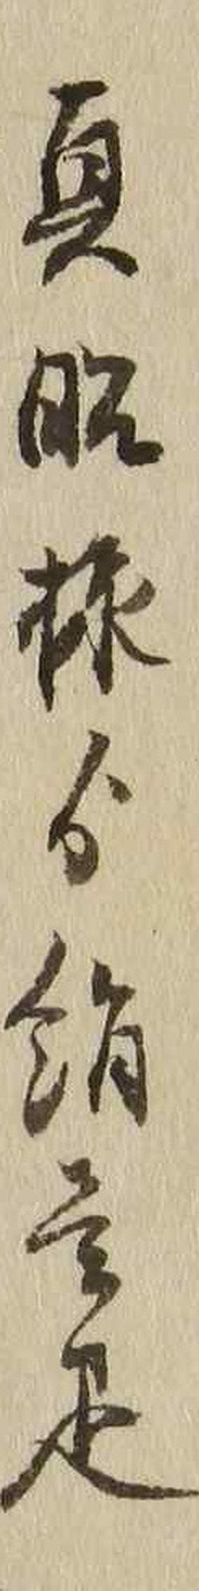真昭様ゟ絹壱疋
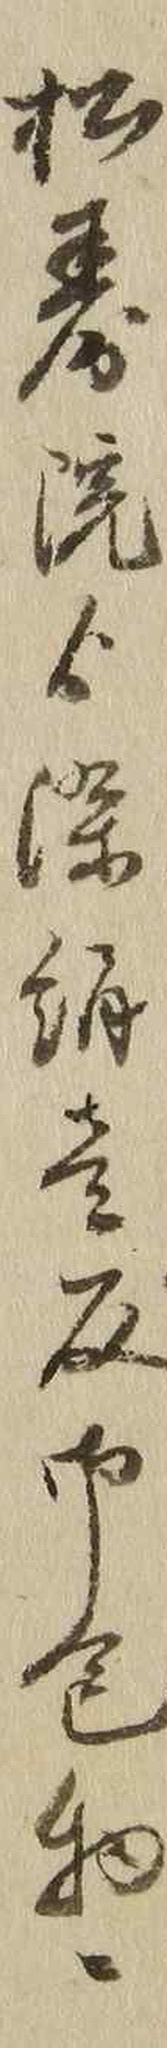松寿院ゟ染絹壱反御包物被
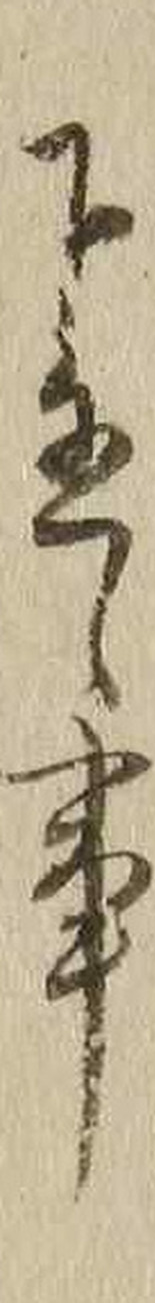下置候事
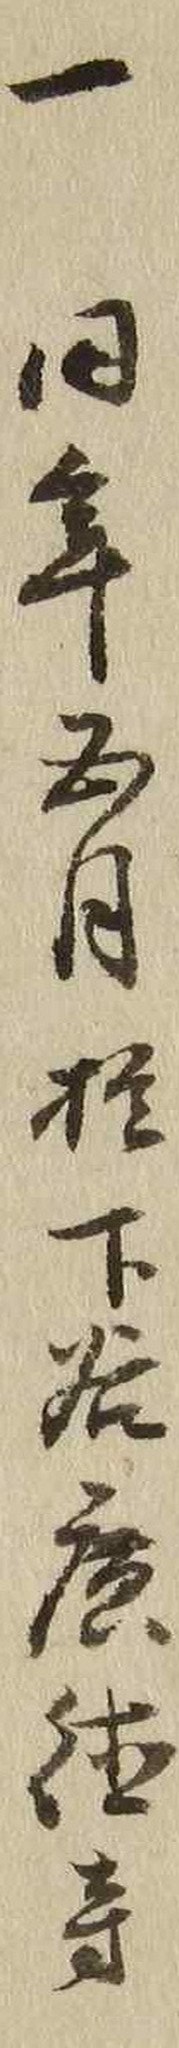一同年五月於下谷広徳寺
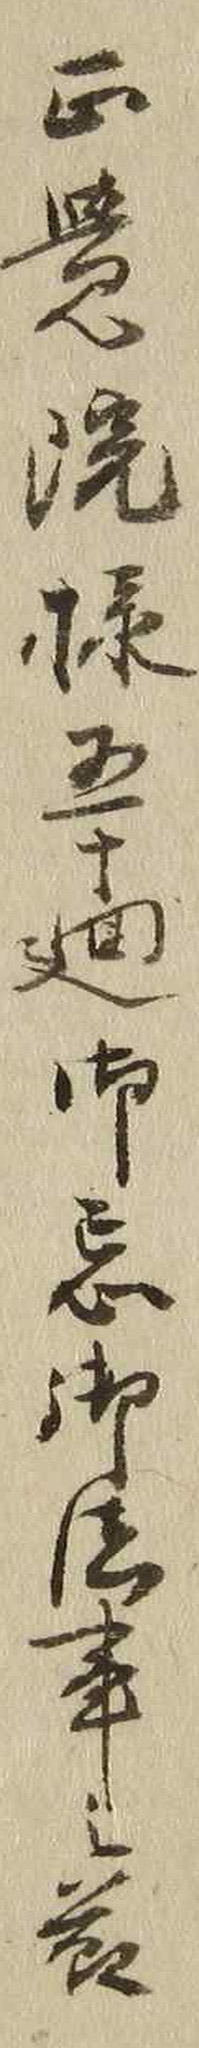正覚院様五十廻御忌御法事之節
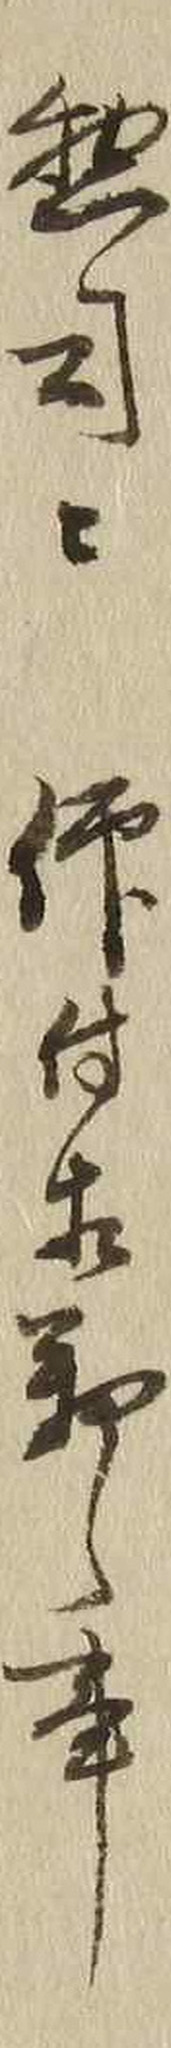惣司被仰付相勤候事
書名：諸士系譜　巻之225　ま之部6
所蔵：会津若松市立会津図書館
